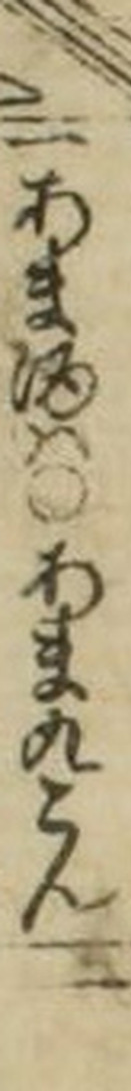一あま酒は○あま九こん
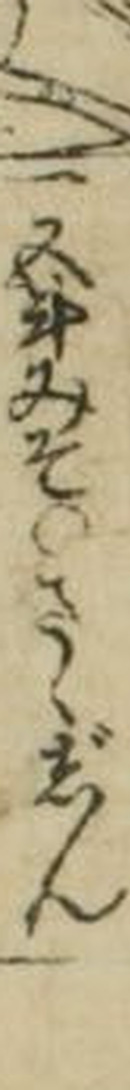一五斗みそ○さゝじん
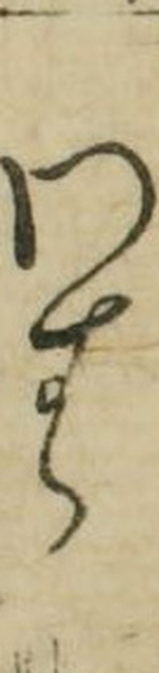わすら
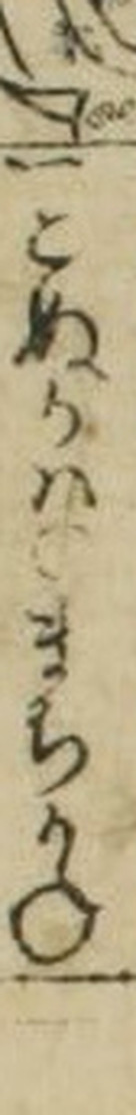一こぬかは○まちかね
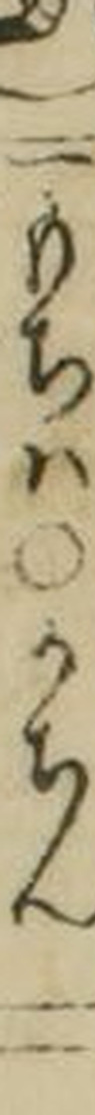一もちは○かちん
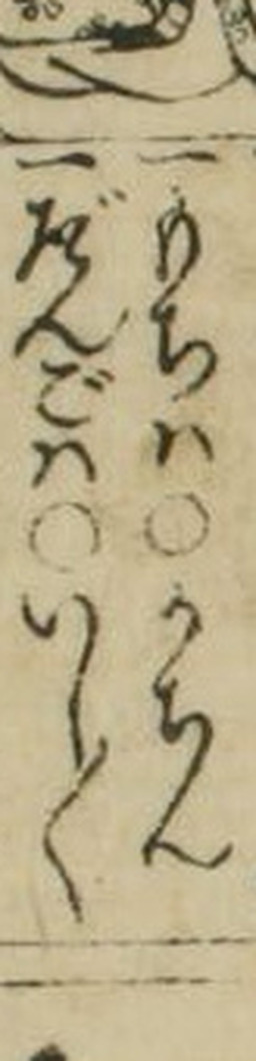一だんごは○いし〳〵
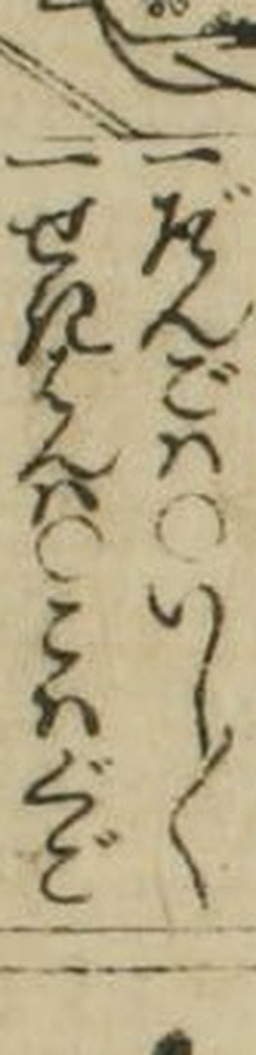一せきはんは○こはぐご
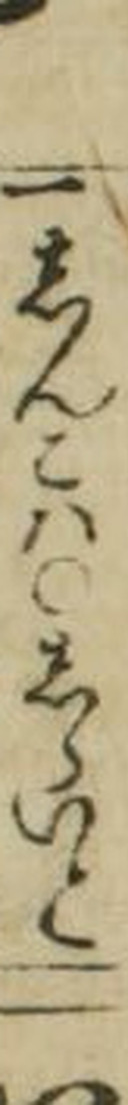一しんこは○しらいと
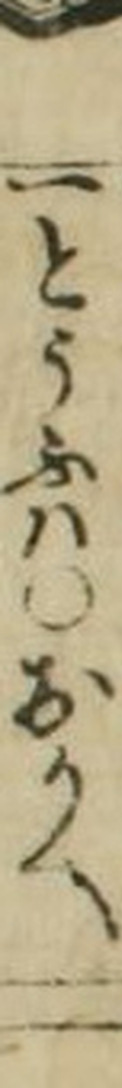一とうふは○おかへ
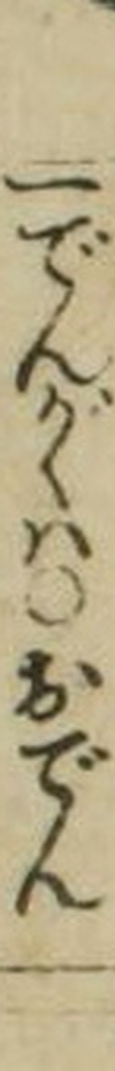一でんがくは○おでん
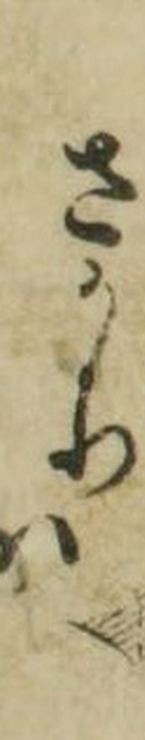さかりは
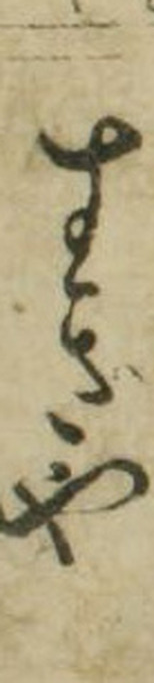すぎや
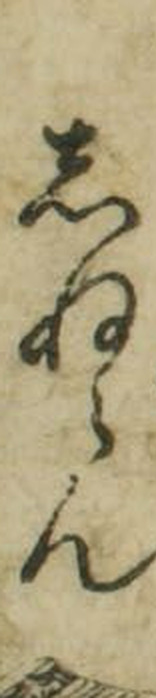しぬらん

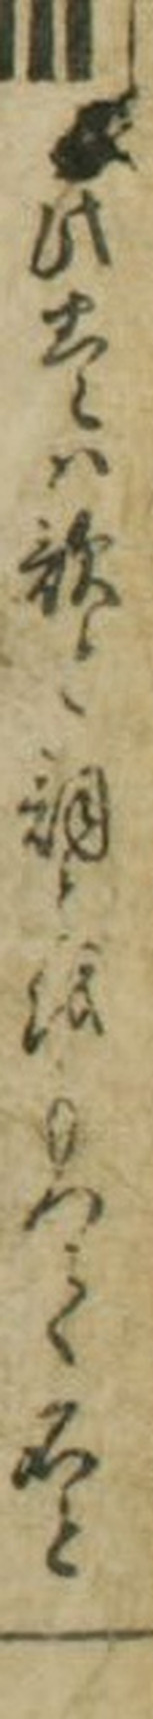此巻は歌と詞とをもつて名と
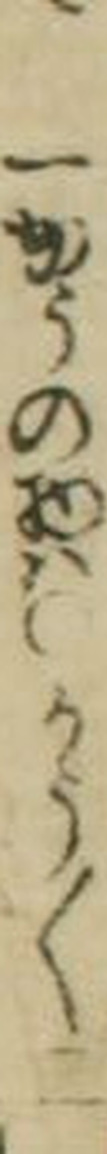一かうの物は○かう〳〵
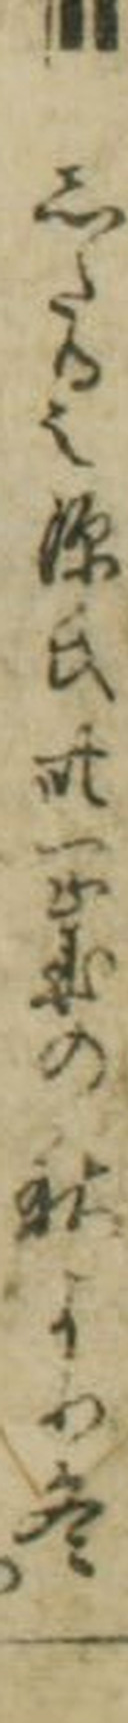したる也源氏卅一歳の秋より冬
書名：女源氏教訓鑑
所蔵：東京学芸大学附属図書館
